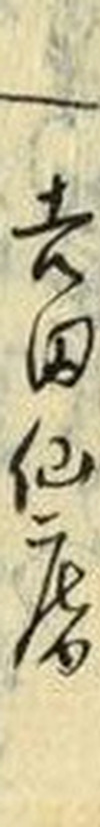吉田仙庵
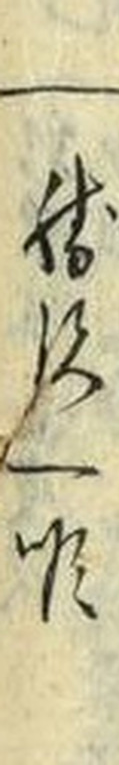勝沢一順
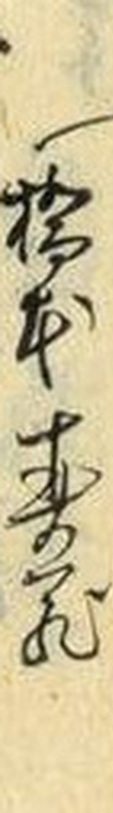橋本春蔵
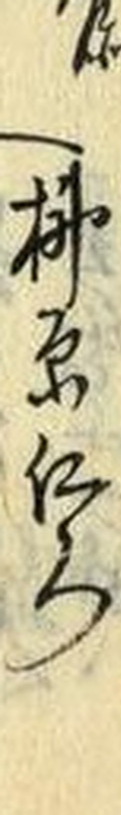榊原仁右衛門
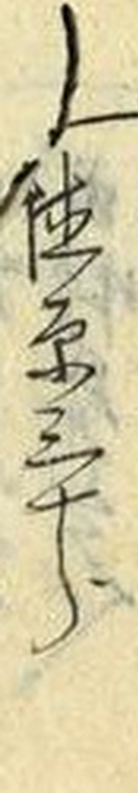埴原三十郎
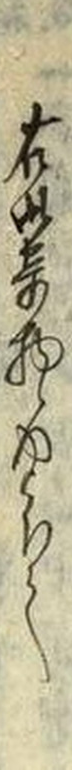右御寄物被為下之
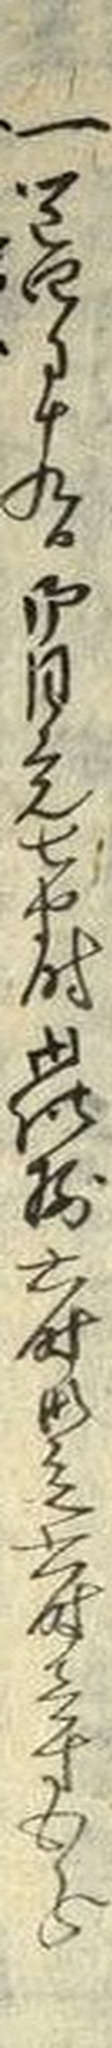一閏四月十九日御目覚七半時御供揃六時御立六時壱寸五分
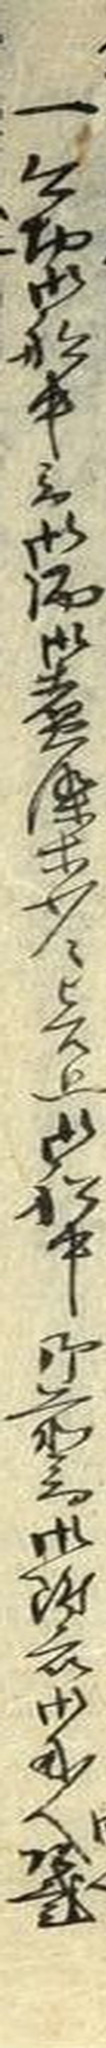一今切初御船中二而御酒御煮染等少々被召上御船中御前ニ而御附衆御用人頂戴
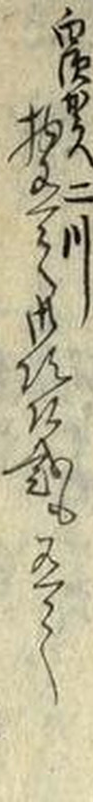物有之御次頂戴も有之
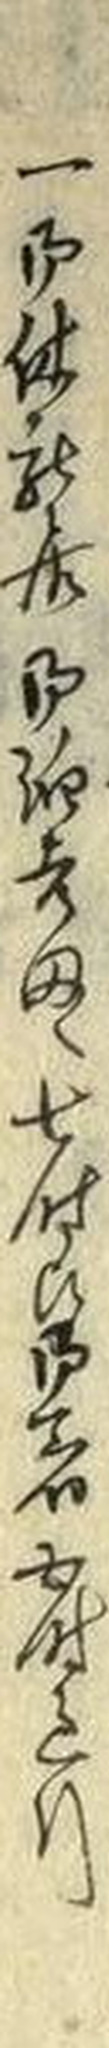一御休新居御泊吉田へ七時頃御着五時過引
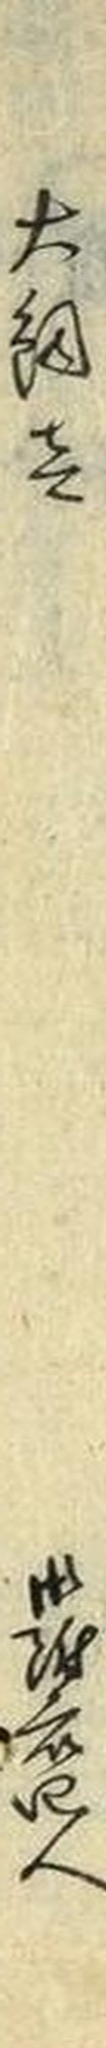大鯛壱御附衆四人
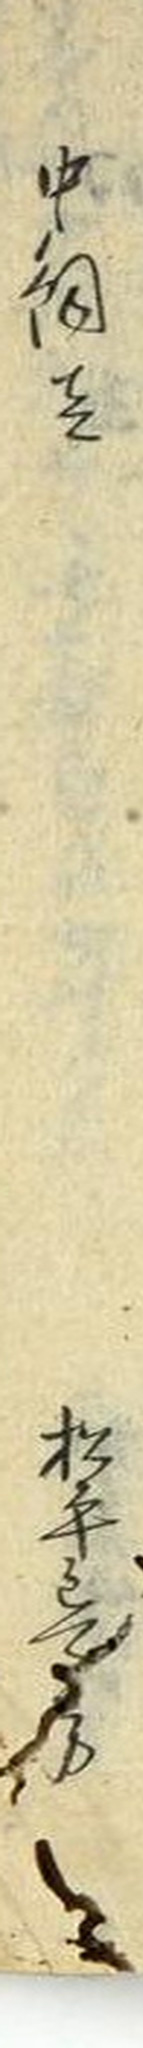中鯛壱松平主馬方

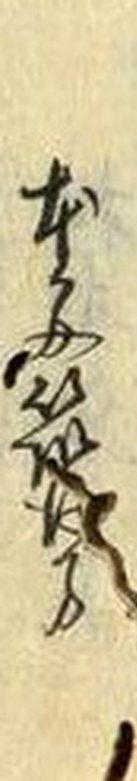同壱本多筑後方
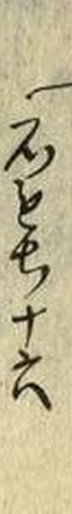石もち十六
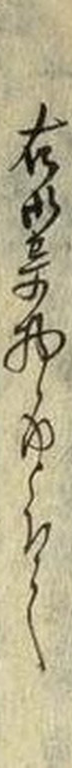右御寄物之内被下之
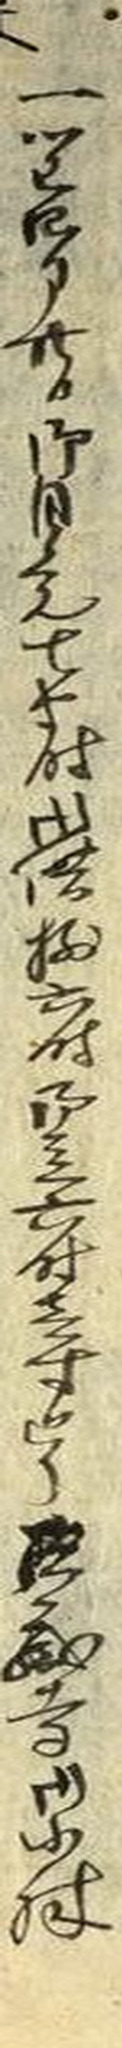一閏四月廿日御目覚七半時御供揃六時御立六時壱寸廻り法蔵寺御小休
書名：少傅日録抄（斉善付側向頭取日記、江戸并道中、初入在国、逝去後…
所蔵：福井県文書館 Fukui Prefectural Archives
